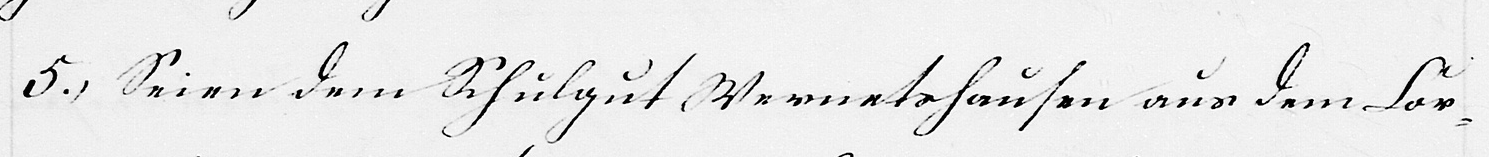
5.) Seien dem Schulgut Wernetshausen aus dem Cor¬
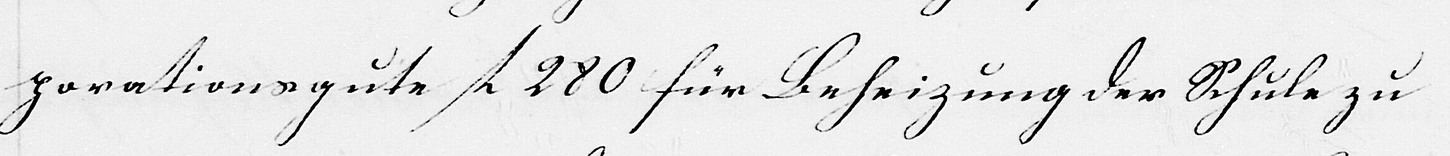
porationsgute fl 280 für Beheizung der Schule zu
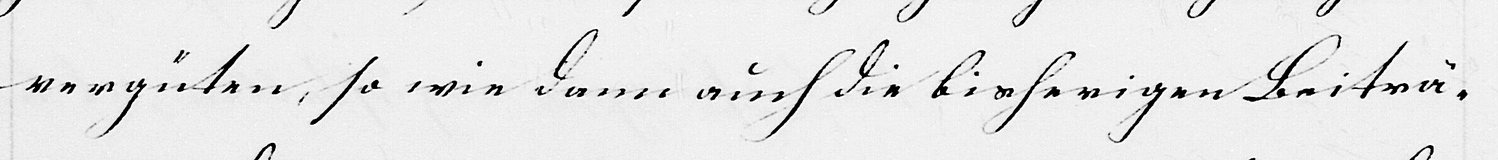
vergüten, so wie dann auch die bisherigen Beiträ¬
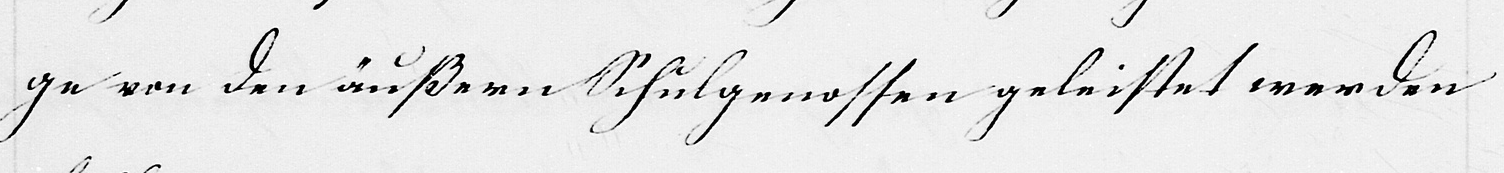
ge von den äußern Schulgenossen geleistet werden
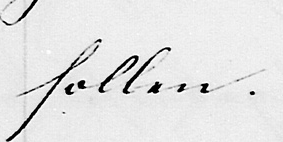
sollen.
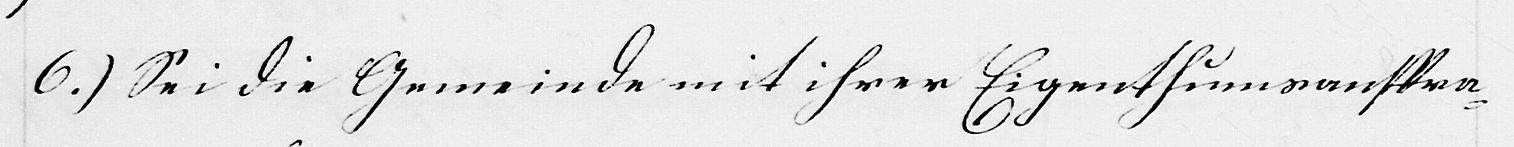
6.) Sei die Gemeinde mit ihrer Eigenthumsanspra¬
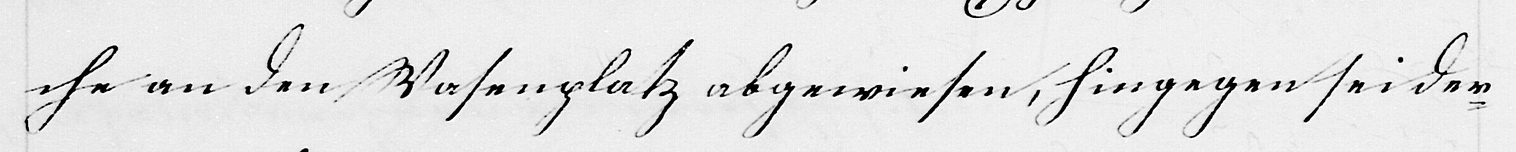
che an den Wasenplatz abgewiesen, hingegen sei der¬
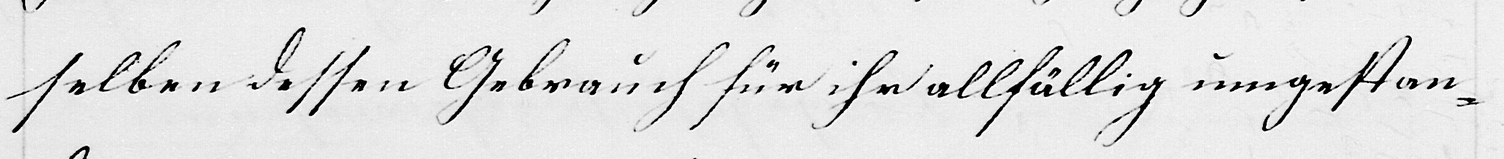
selben dessen Gebrauch für ihr allfällig umgestan¬
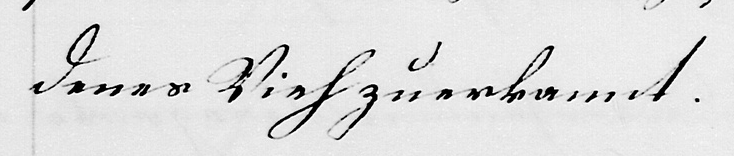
denes Vieh zuerkannt.
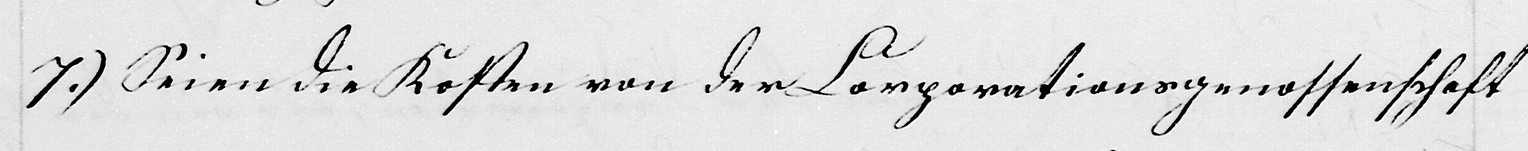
7.) Seien die Kosten von der Corporationsgenossenschaft
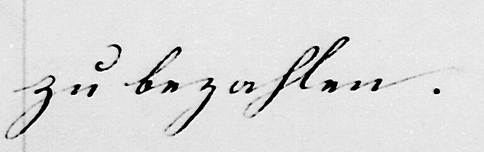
zu bezahlen.
